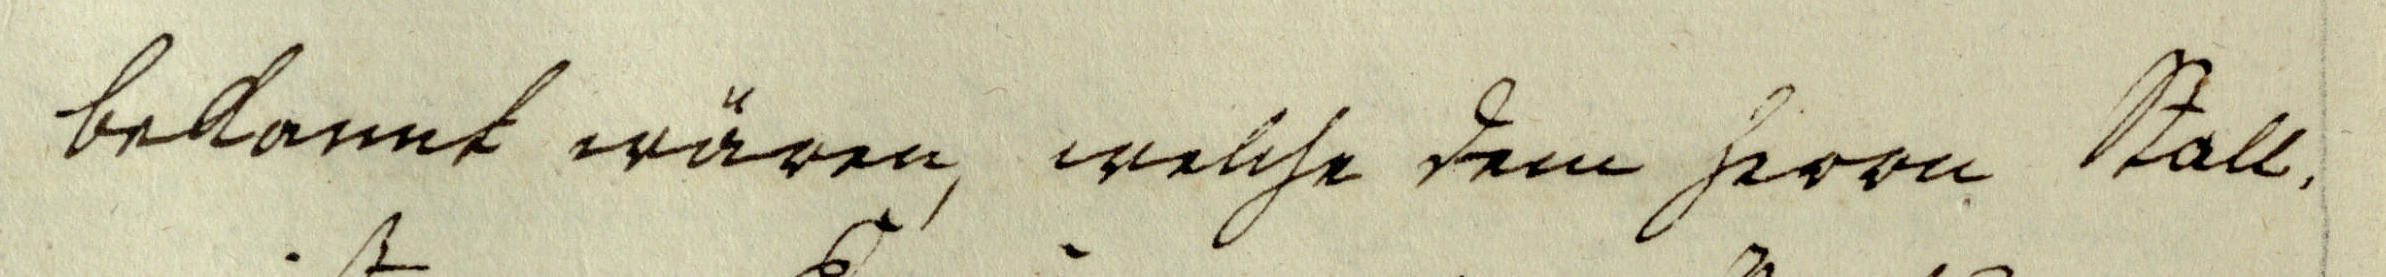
bekannt wären welche dem Herrn Stall¬
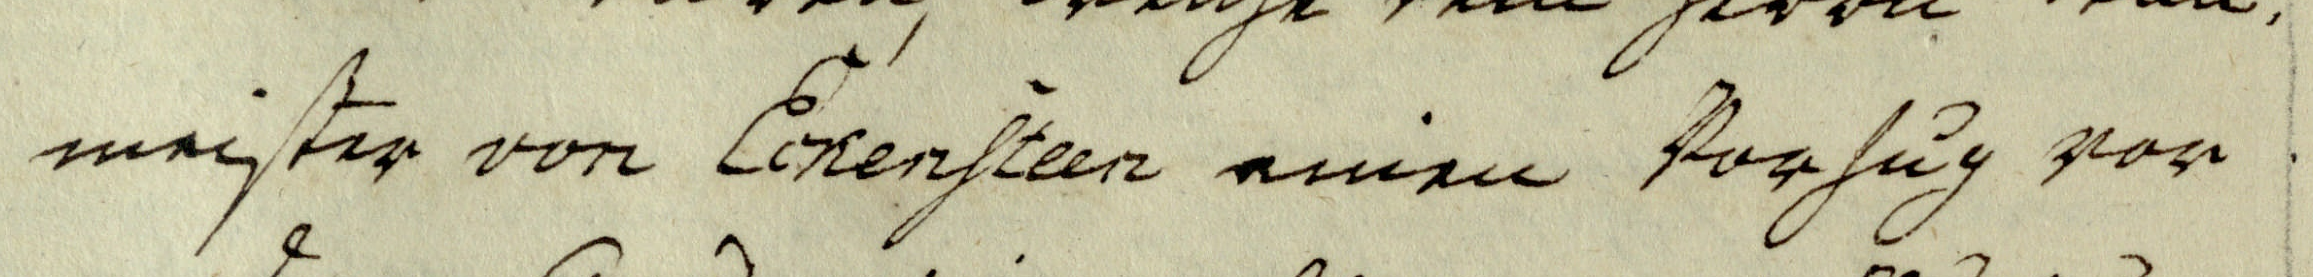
meister von Eckensteen einen Vorzug vor
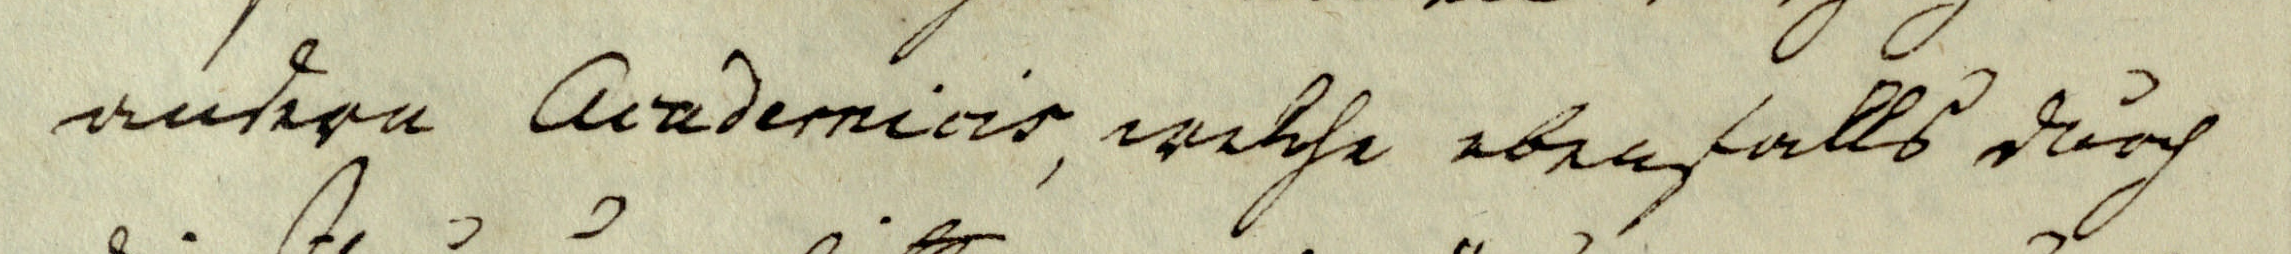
andern Academicis, welche ebenfalls durch
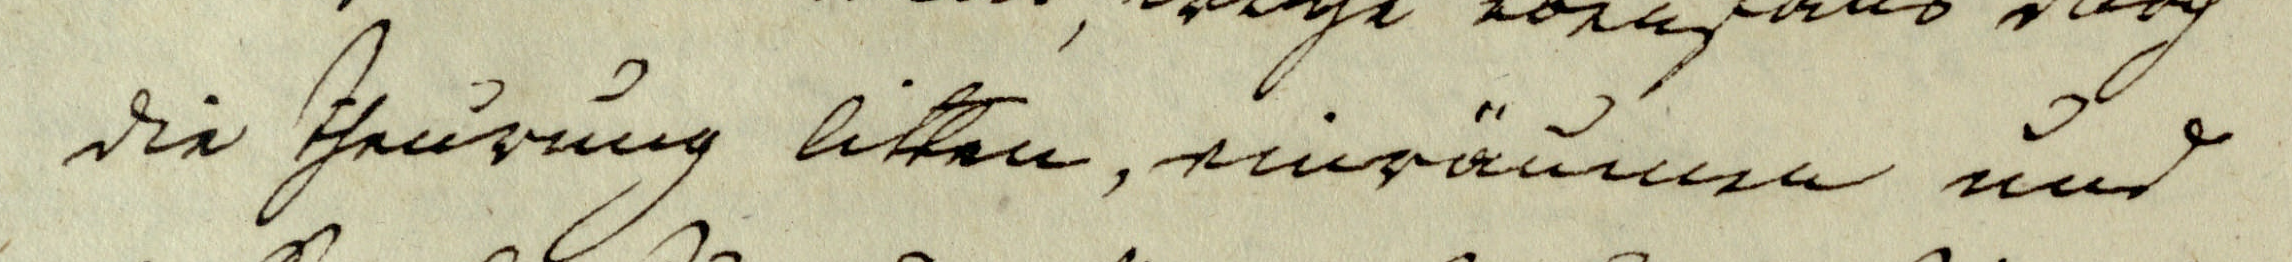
die Theurung litten, einräumen und
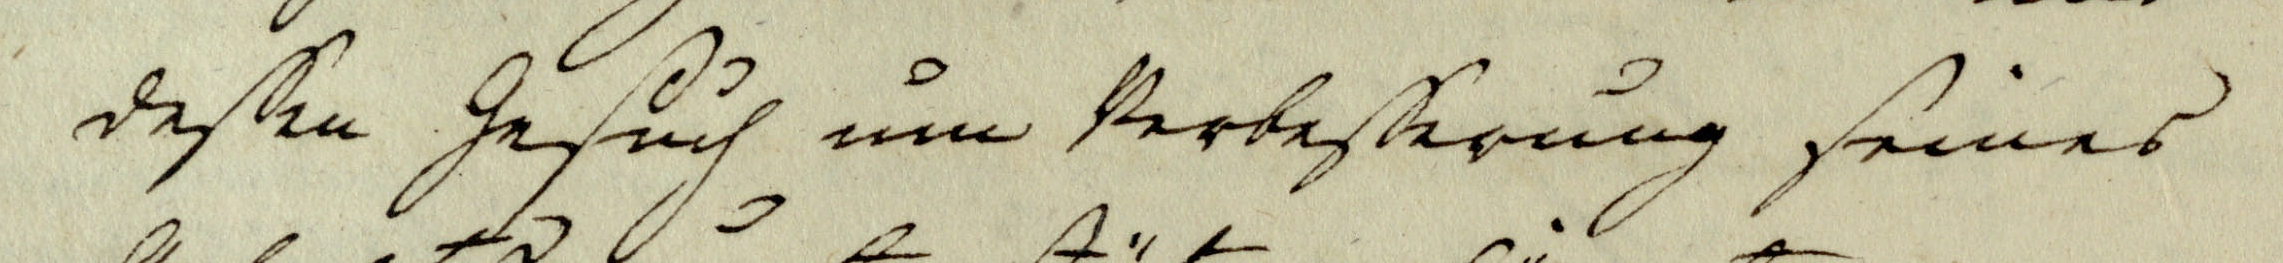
dessen Gesuch um Verbesserung seines
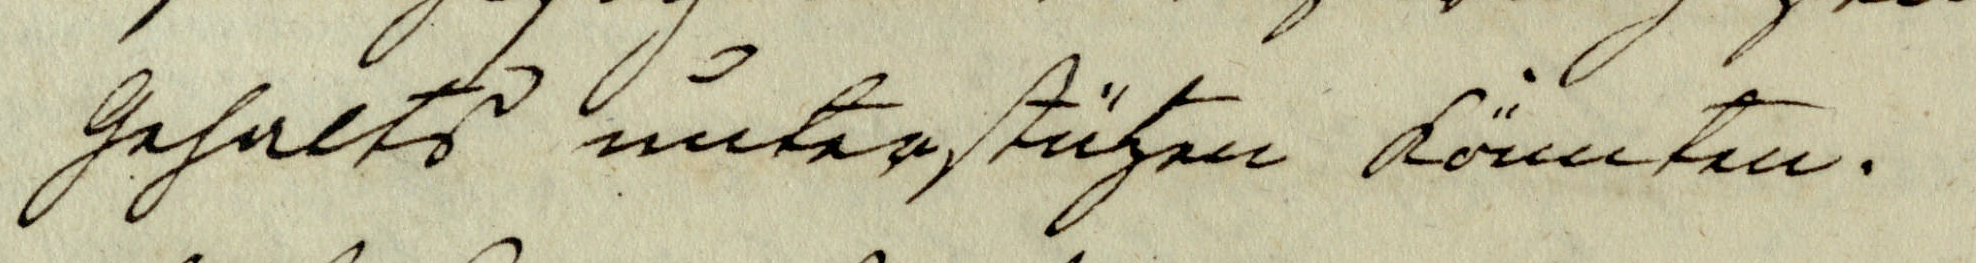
Gehalts unterstützen könnten.
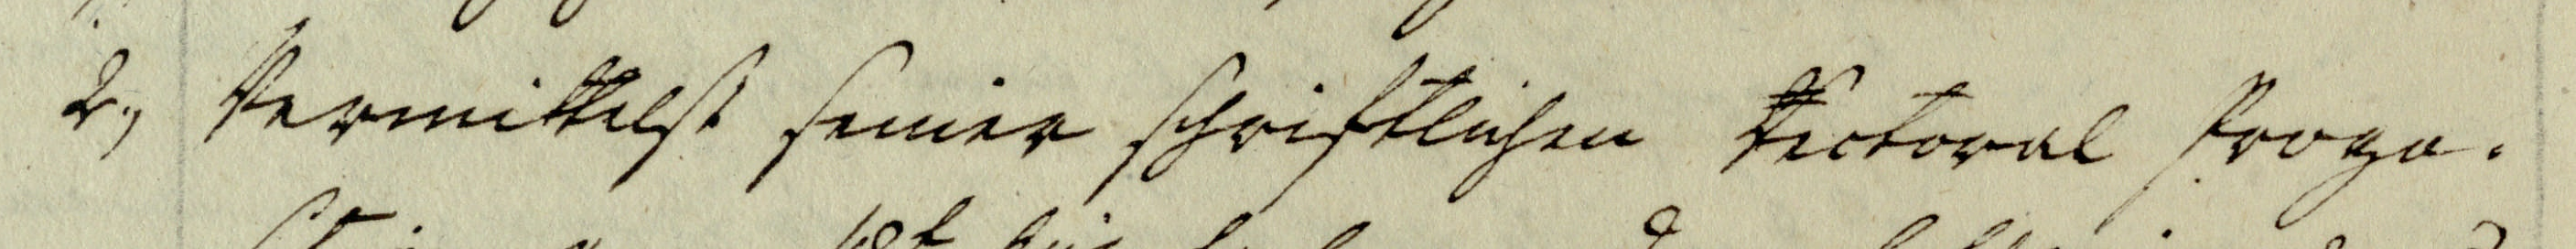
2., Vermittelst seiner schriftlichen Rectoral Propo¬
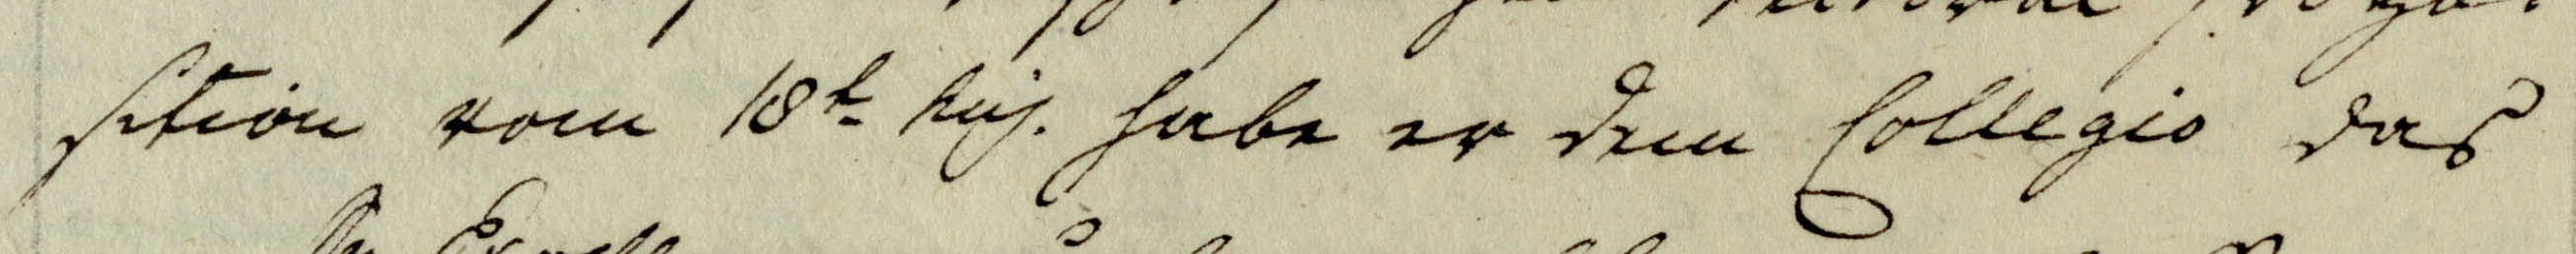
sition vom 18. huj. habe er dem Collegio das
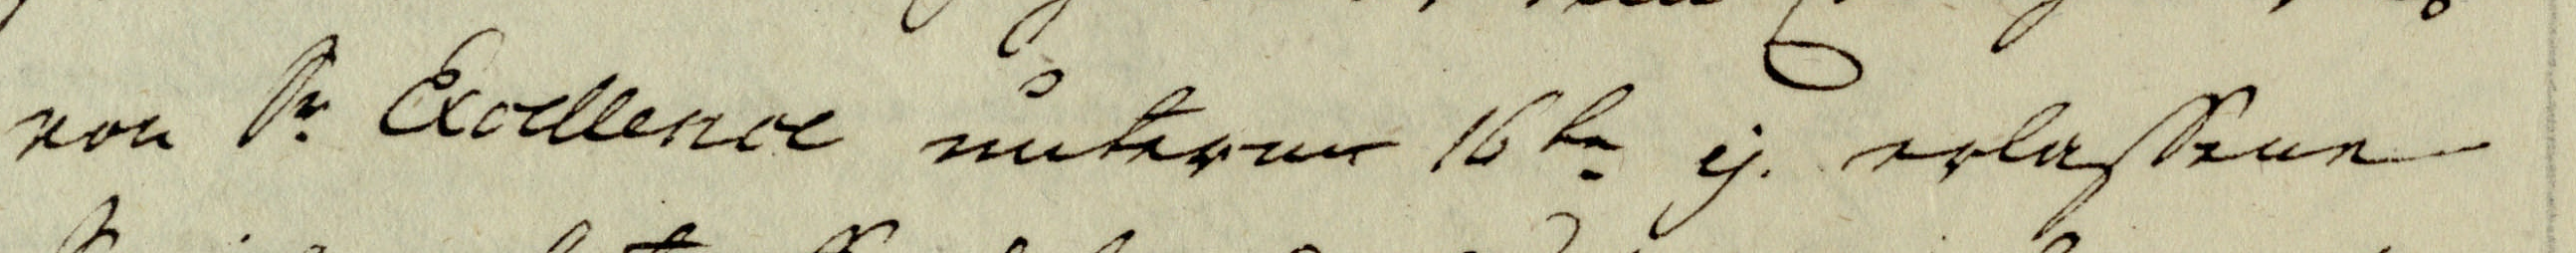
von Sr Excellence unterm 16 ten ej. erlassene
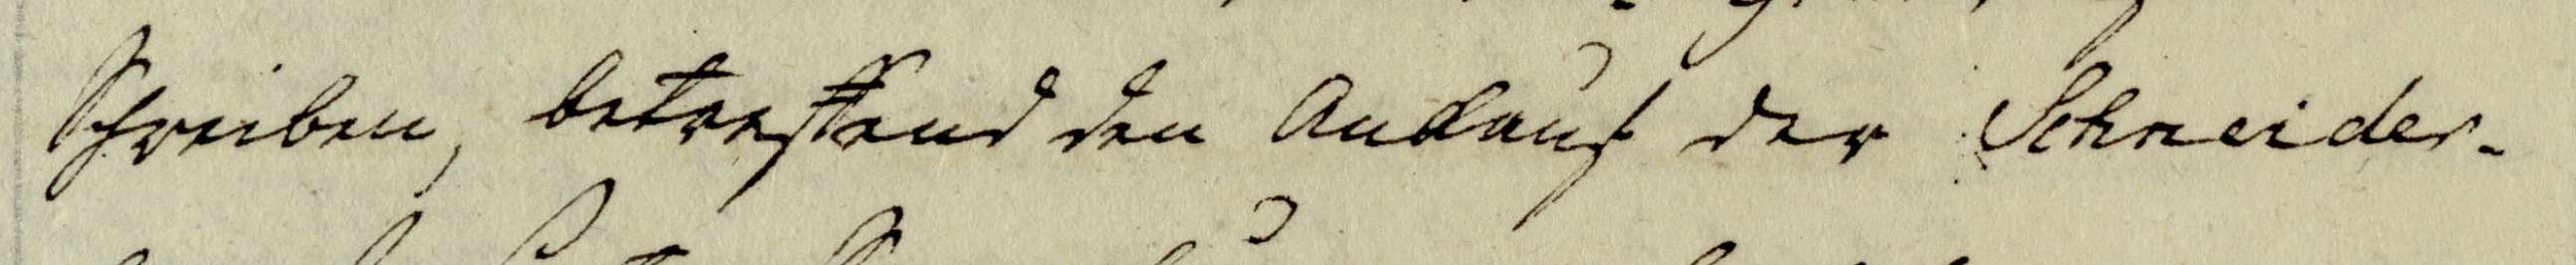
Schreiben, betreffend den Ankauf der Schneider¬
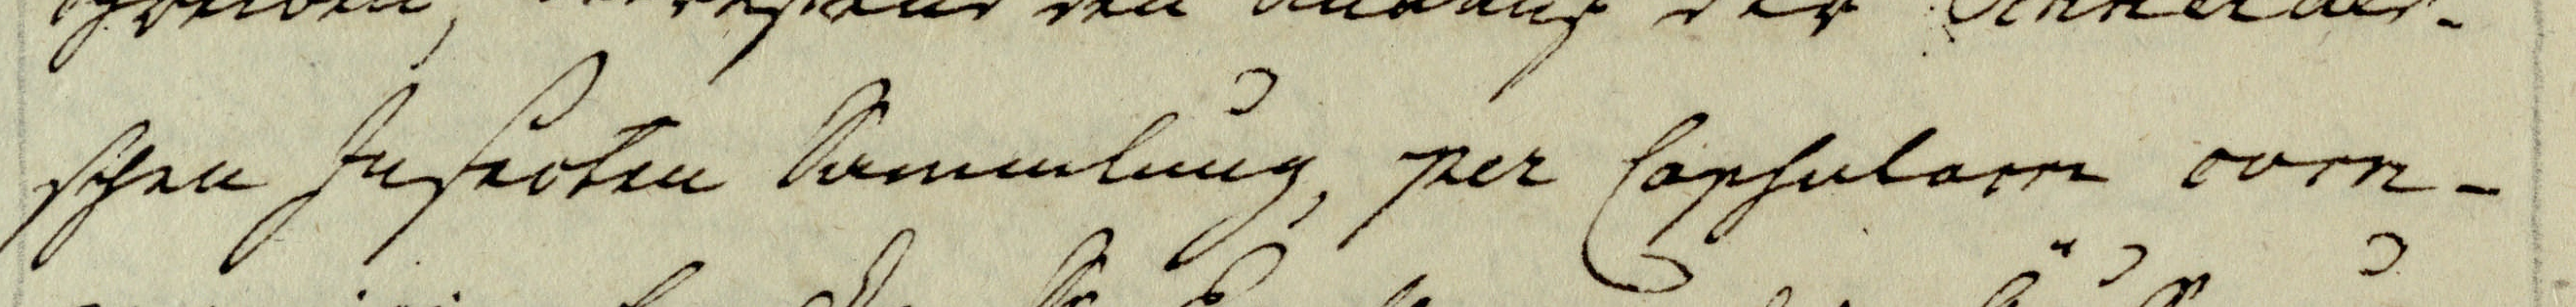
schen Insecten Sammlung, per Capsulam com¬
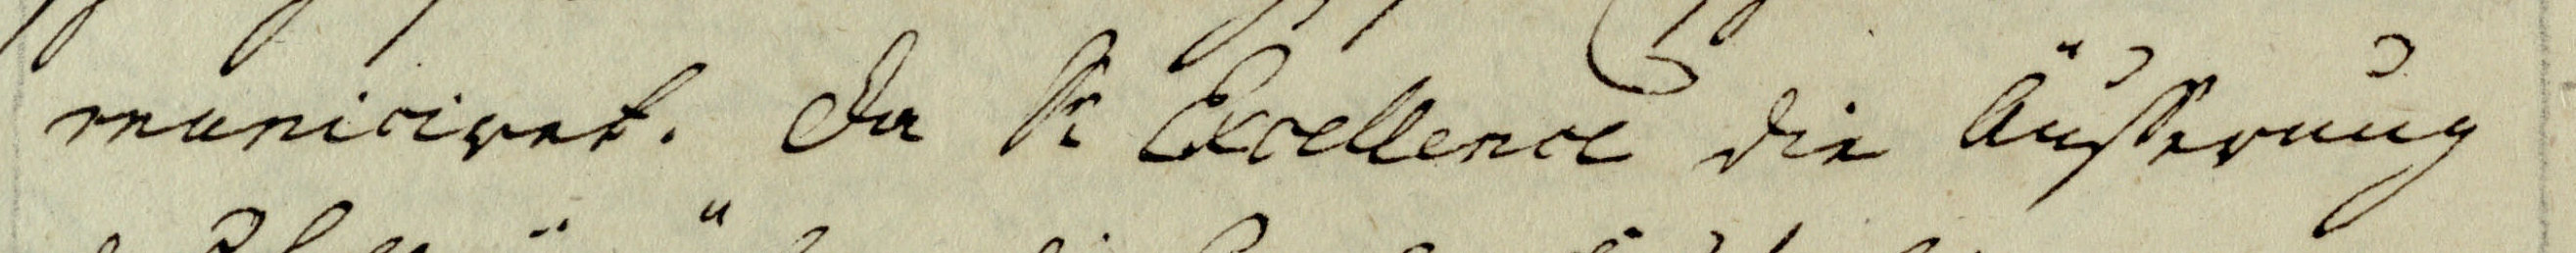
municiret. Da Sr Excellence die Äusserung
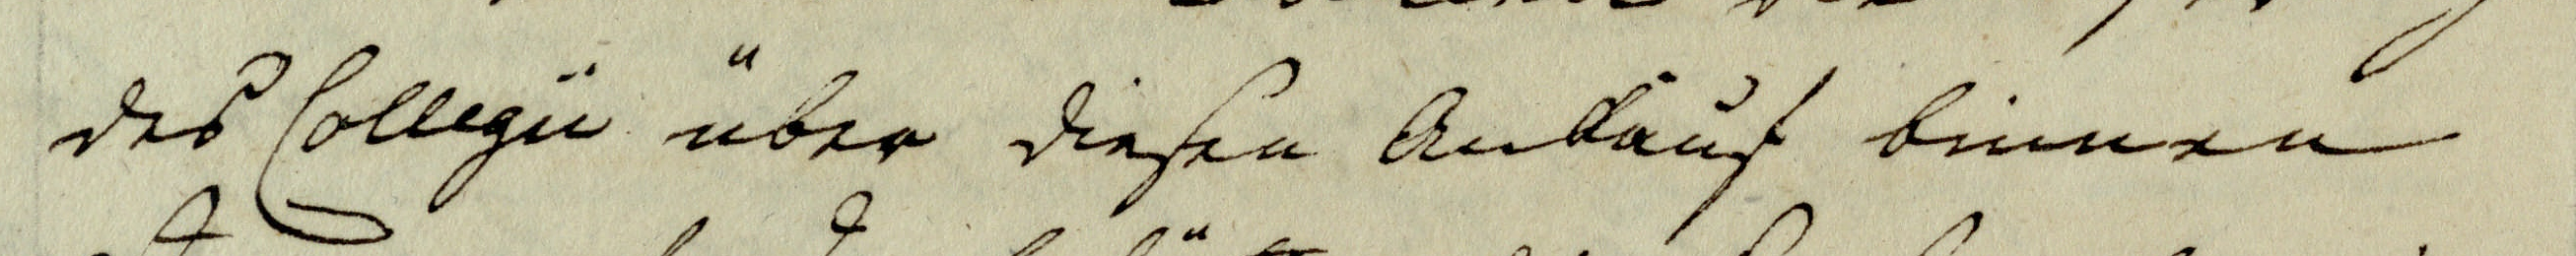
des Collegii über diesen Ankauf binnen
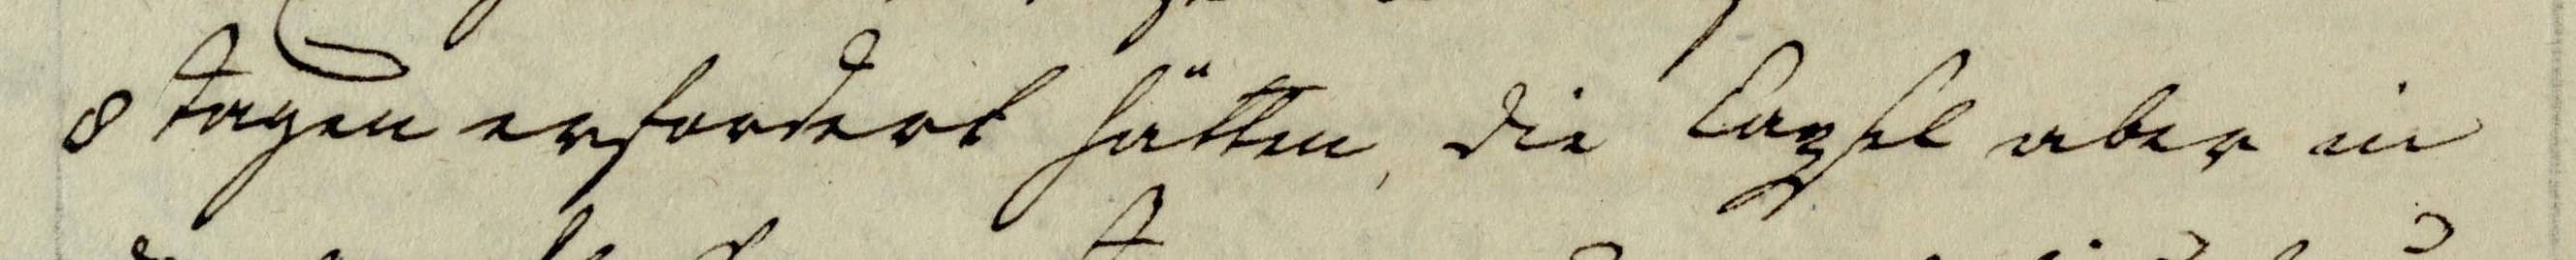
8 Tagen erfordert hätten, die Capsel aber in
